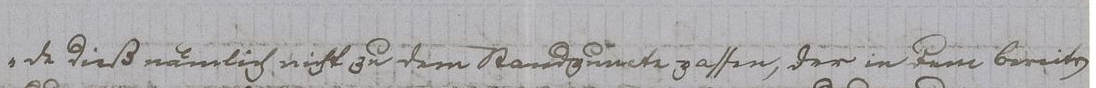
de dieß nämlich nicht zu dem Standpuncte passen, der in dem bereits
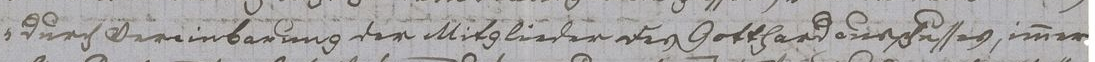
durch Vereinbarung der Mitglieder des Gotthardausschusses, immer-
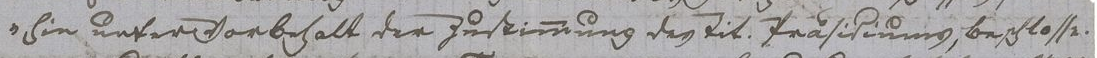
hin unter Vorbehalt der Zustimmung des Tit. Präsidiums, beschlosse-
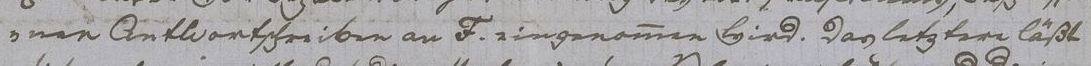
nen Antwortschreiben an F. eingenommen wird. Das letztere läßt
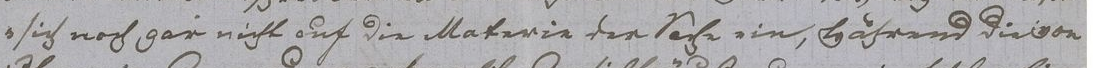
sich noch gar nicht auf die Materie der Sache ein, während die von
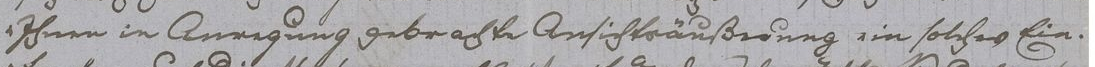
Ihnen in Anregung gebrachte Ansichtsäußerung ein solches Ein-
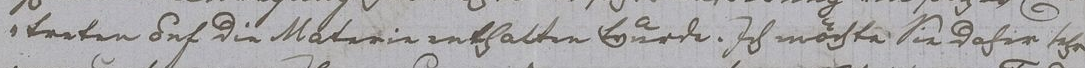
treten auf die Materie enthalten würde. Ich möchte Sie daher sehr
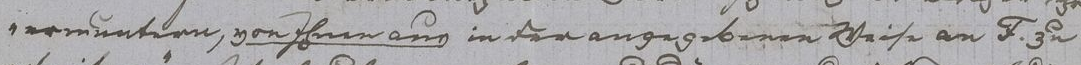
ermuntern, von Ihnen aus in der angegeben Weise an F. zu
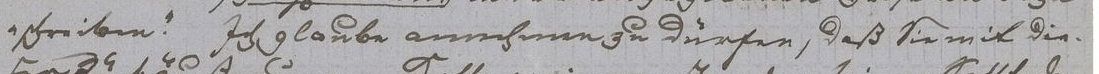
schreiben.» Ich glaube annehmen zu dürfen, daß Sie mit die-
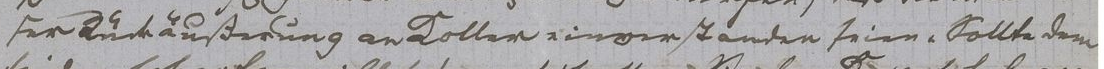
ser Rückäußerung an Koller einverstanden seien. Sollte dem
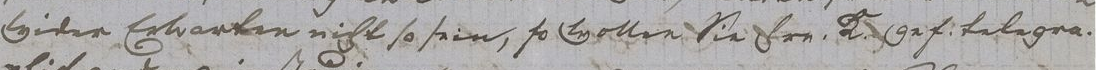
wider Erwarten nicht so sein, so wollen Sie Hrn. K. gef. telegra-
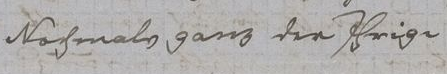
Nochmals ganz der Ihrige
